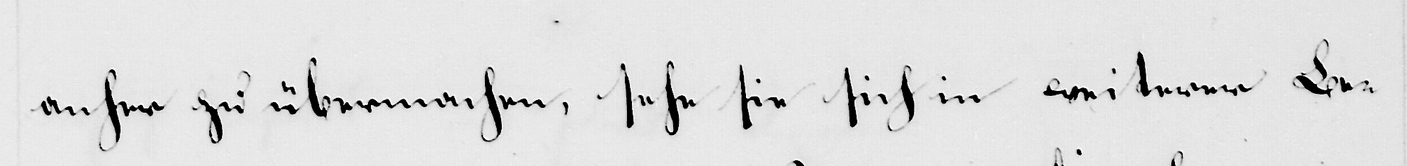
anher zu übermachen, sehe sie sich in weiterer Be¬
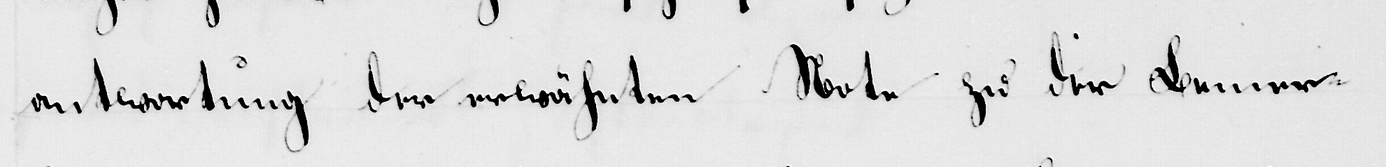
antwortung der erwähnten Note zu der Bemer¬
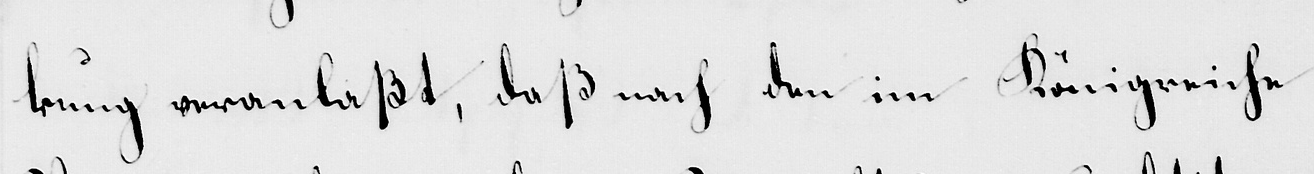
kung veranlaßt, daß nach den im Königreiche
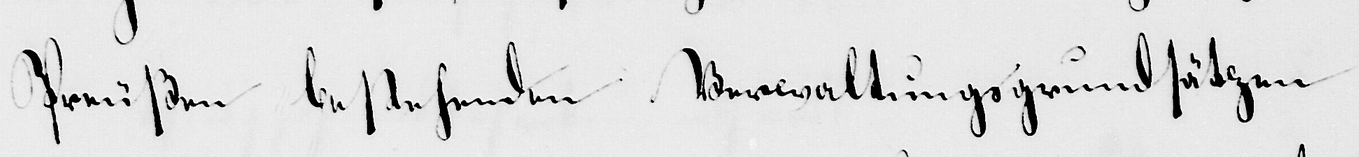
Preußen bestehenden Verwaltungsgrundsätzen
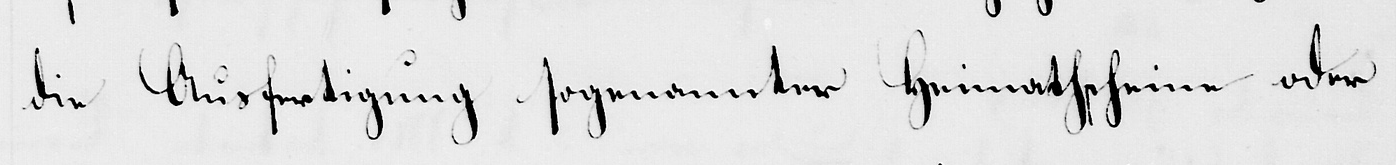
die Ausfertigung sogenannter Heimathscheine oder
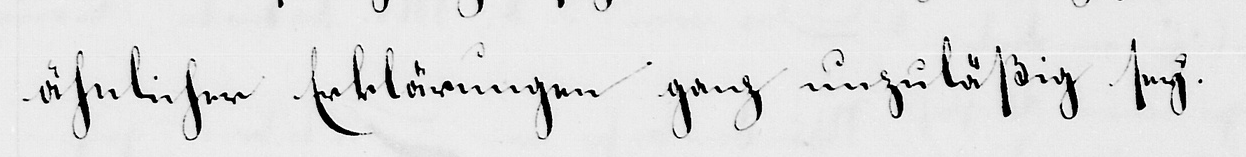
ähnlicher Erklärungen ganz unzuläßig sey.
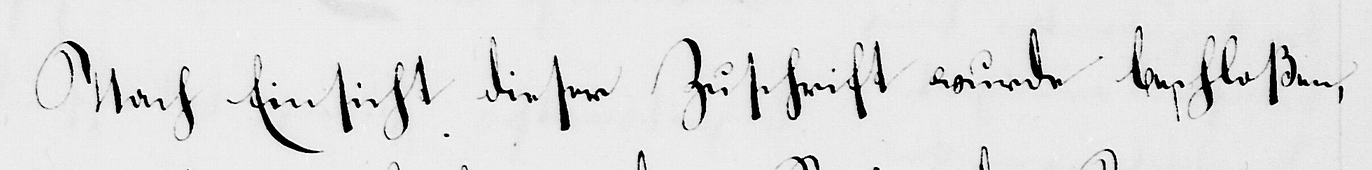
Nach Einsicht dieser Zuschrift wurde beschloßen,
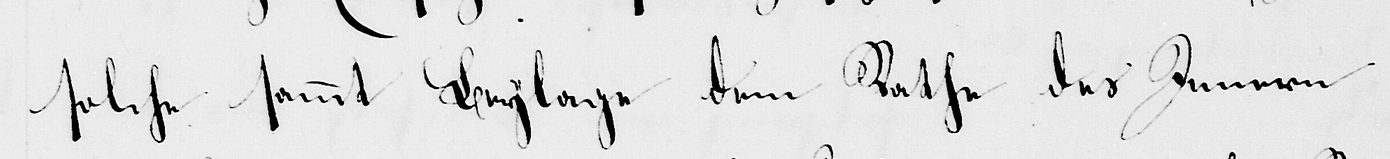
solche sammt Beylage dem Rathe des Innern
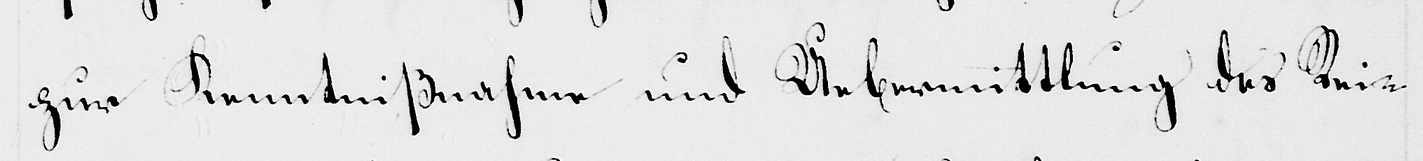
zur Kenntnißnahme und Uebermittlung des Rei¬
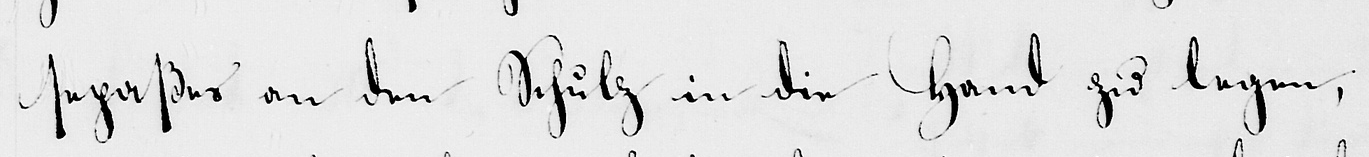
sepaßes an den Schulz in die Hand zu legen,
